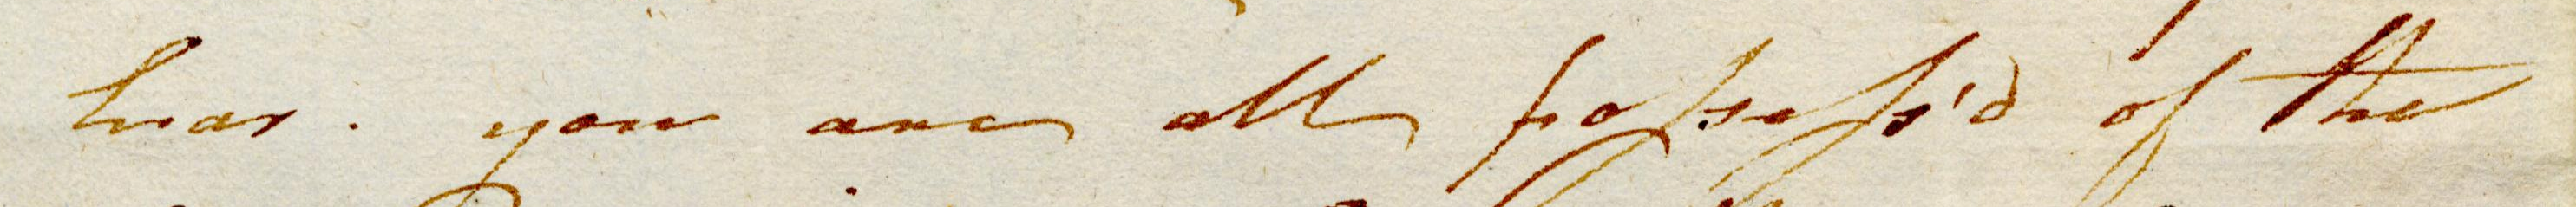hear. you are all possess'd of the
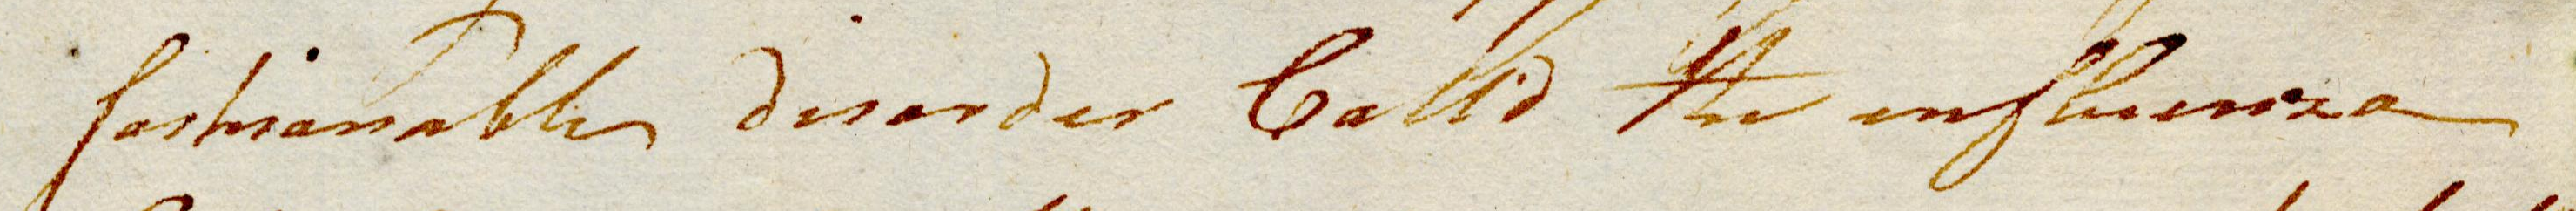fashionable disorder Call'd the influenza
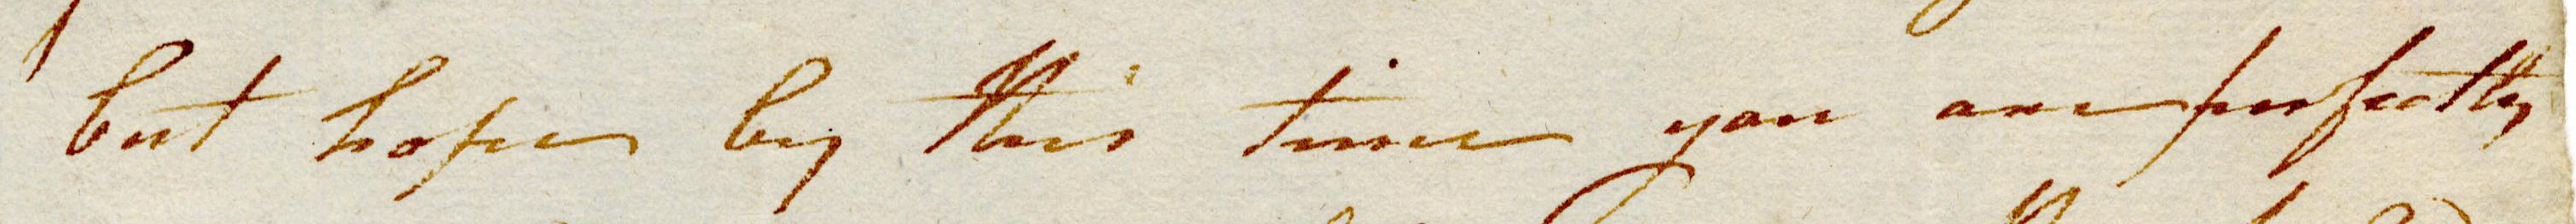but hope by this time you are perfectly
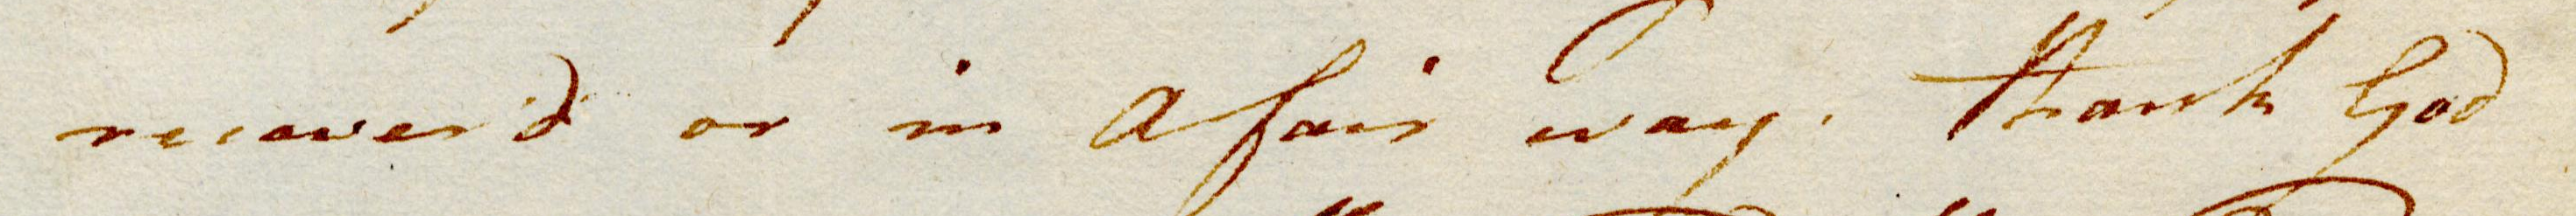recover'd or in a fair way. thank God
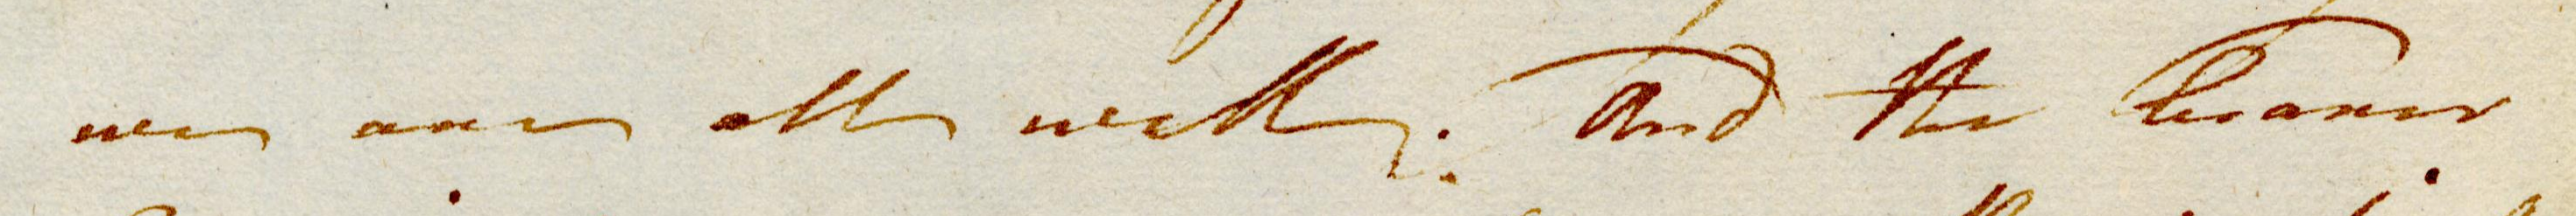we are all well. And the bearer
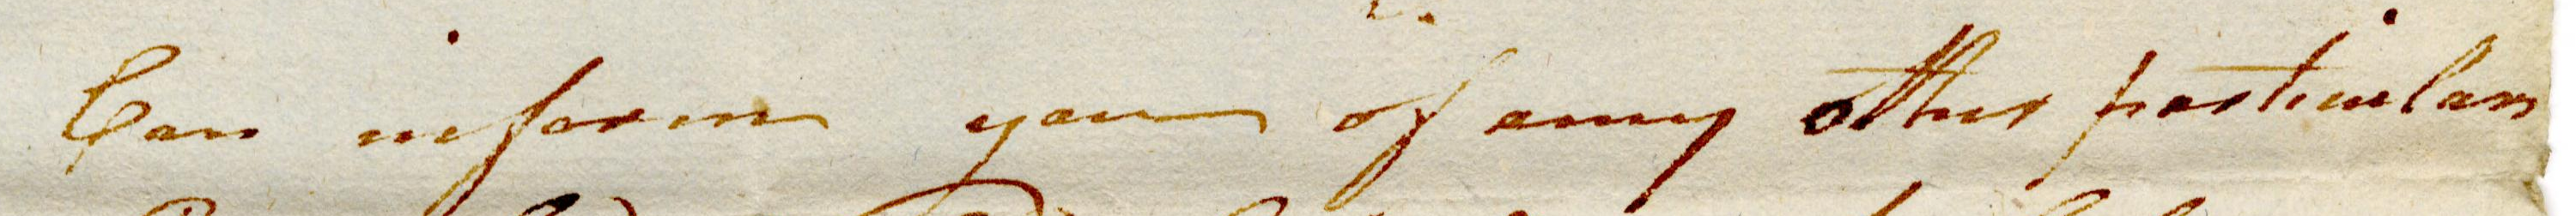Can inform you of any other particulars
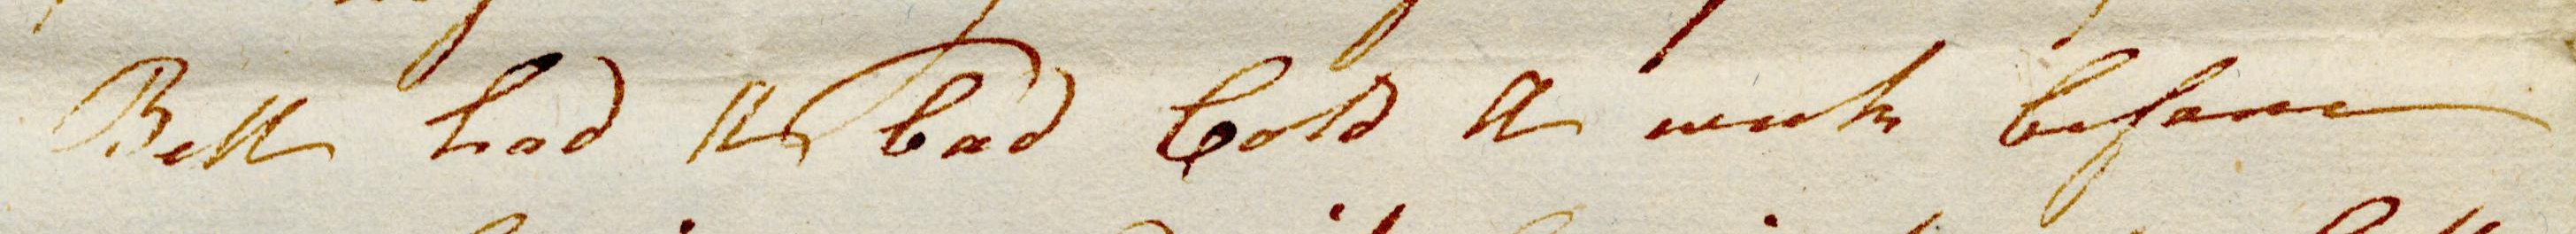Bell had a bad Cold A week before
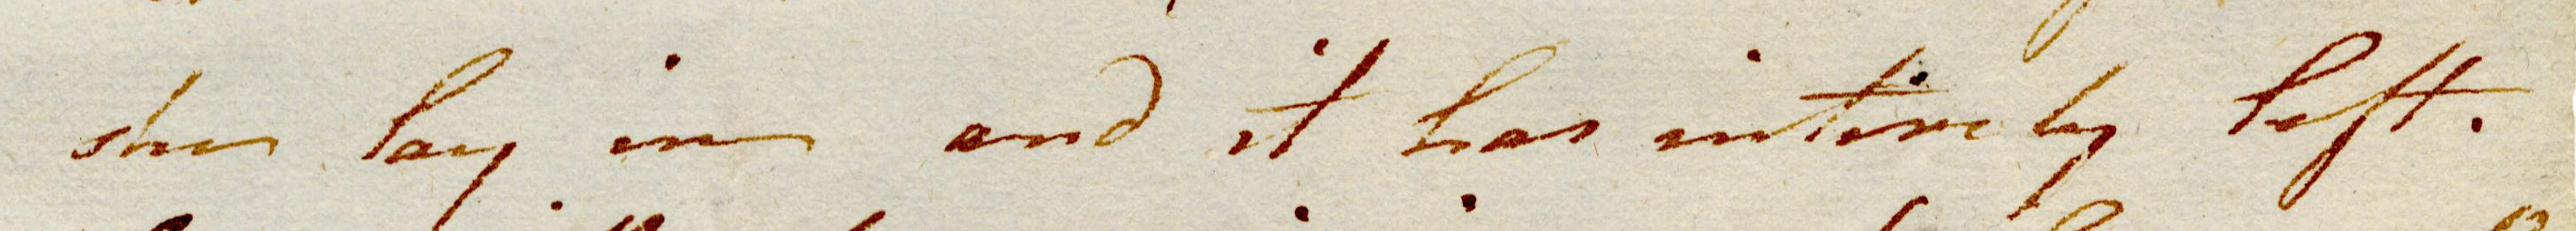she lay in and it has intirely left.
